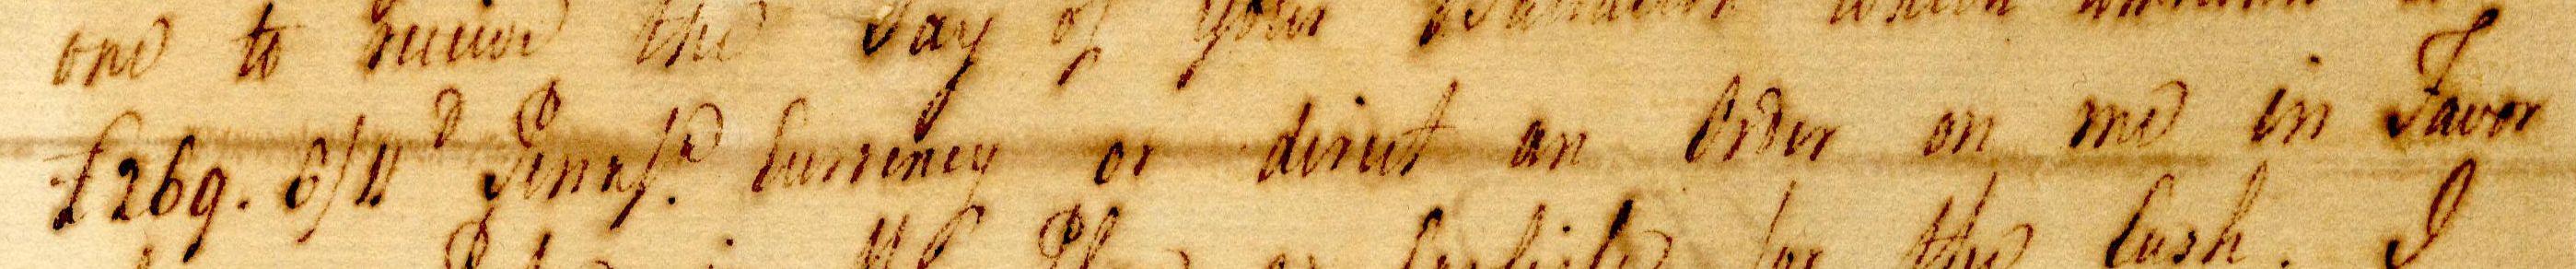£269.6/11^d Penns^a. Currency or direct an Order on me in Favor
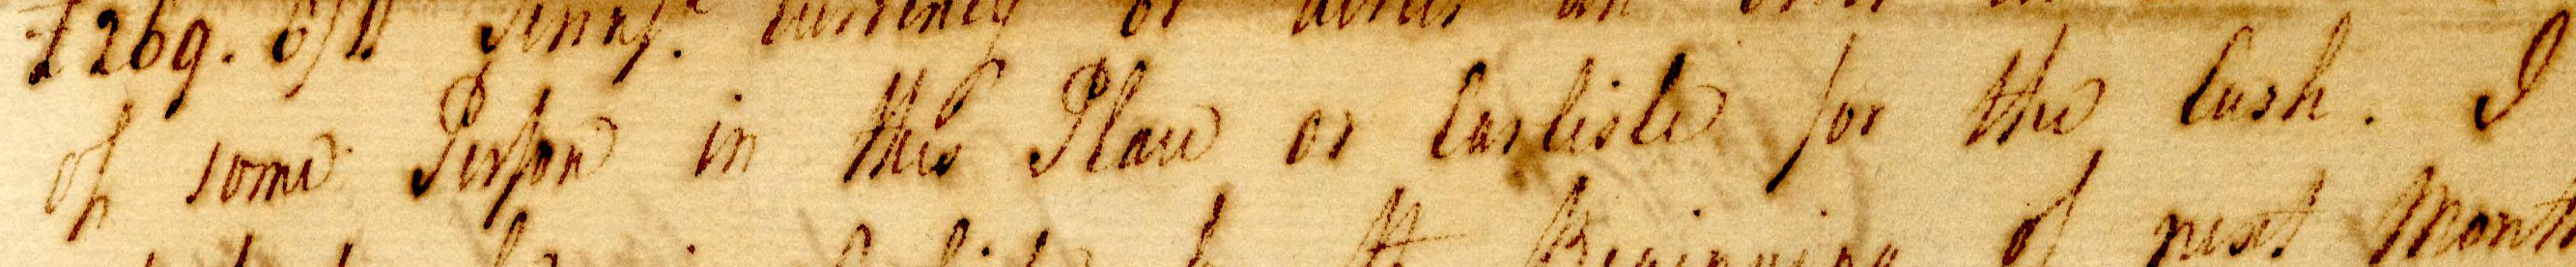of some Person in this Place or Carlisle for the Cash. I
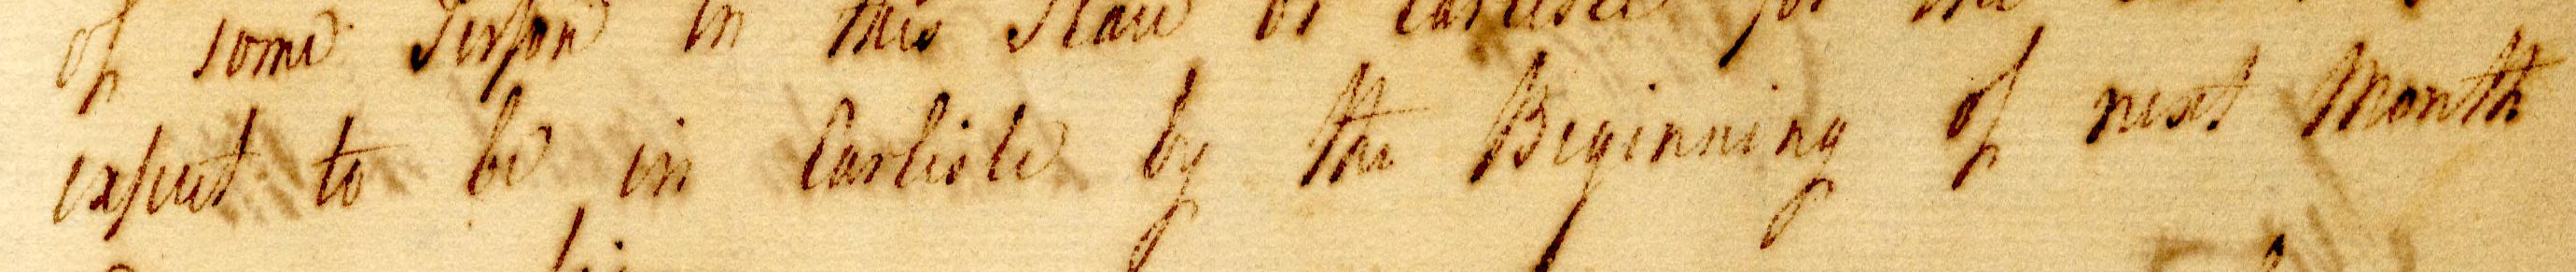expect to be in Carlisle by the Beginning of next Month
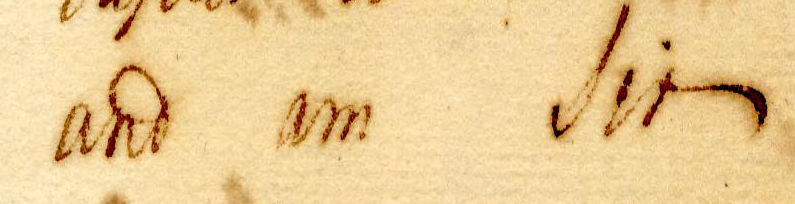and am Sir
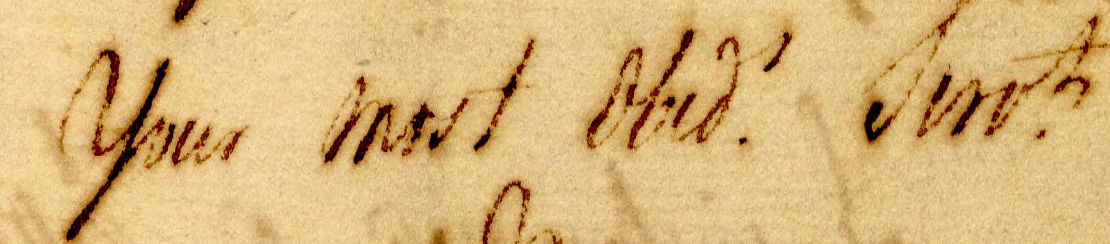Your most Obed^t. Serv^t
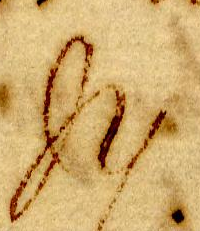JY.
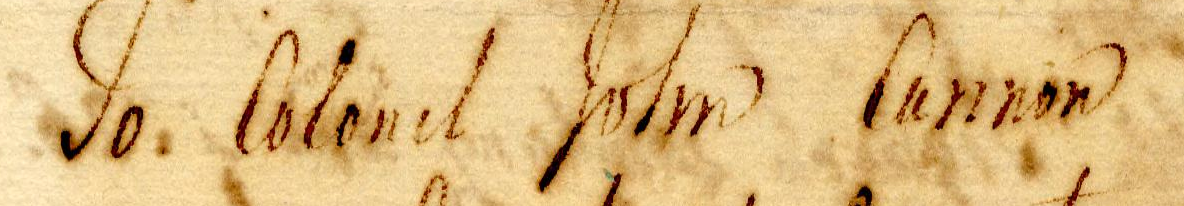To Colonel John Cannon
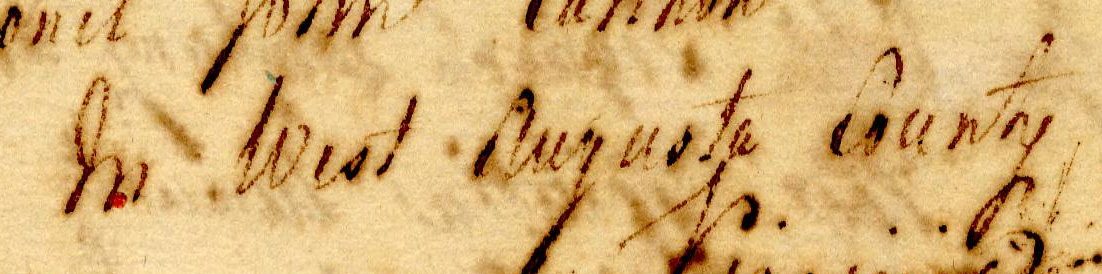In West Augusta County
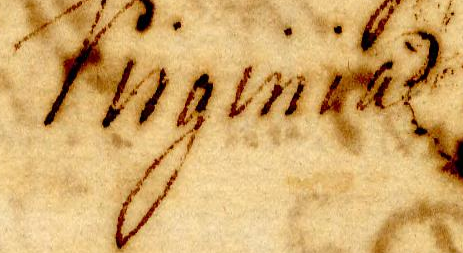Virginia
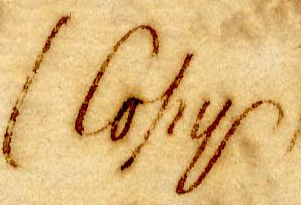(Copy)
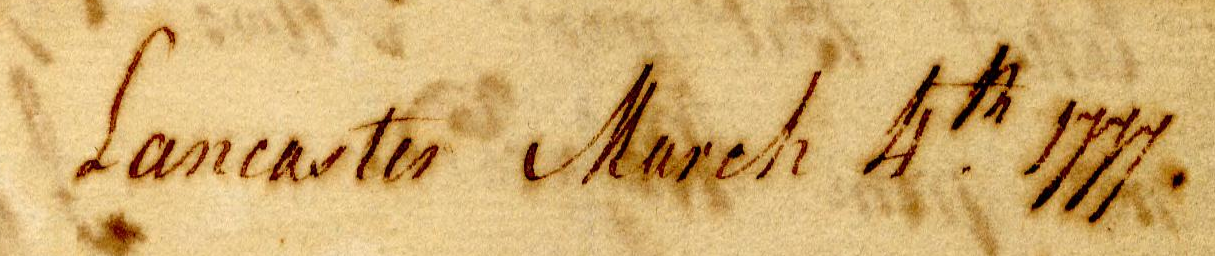Lancaster March 4^th. 1777.
